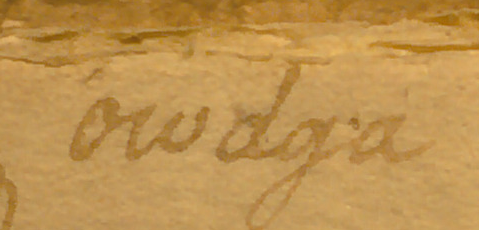owdga
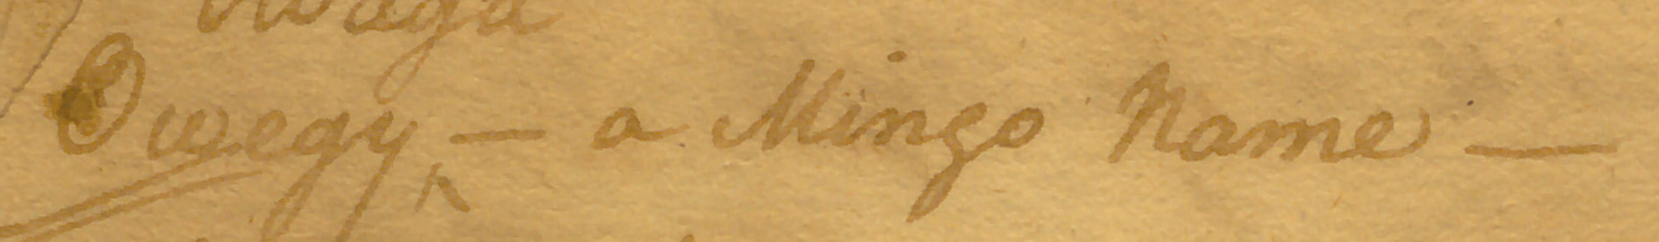Owegy - a Mingo name-
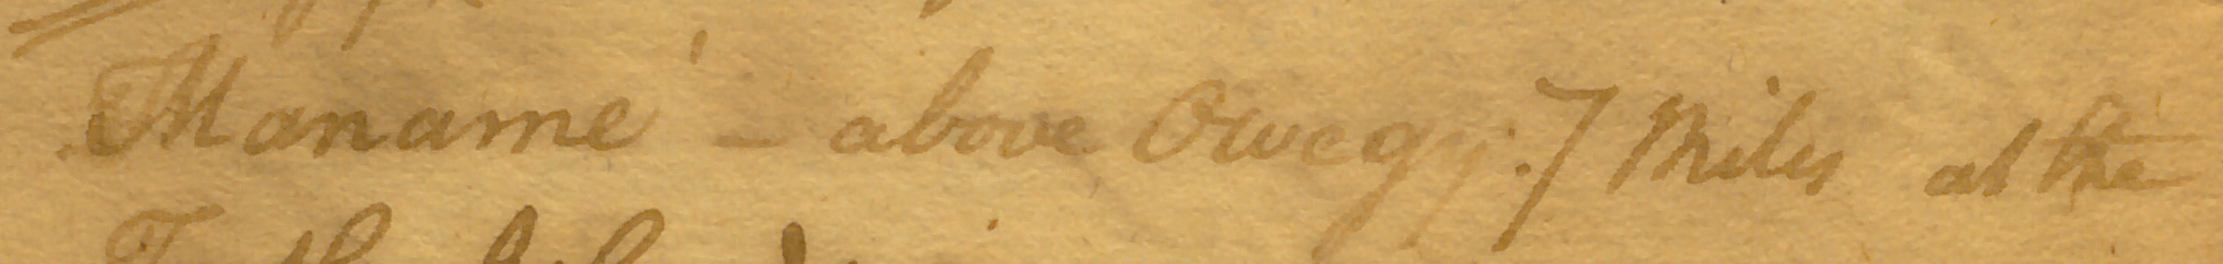Maname - above Owegy: 7 miles at the
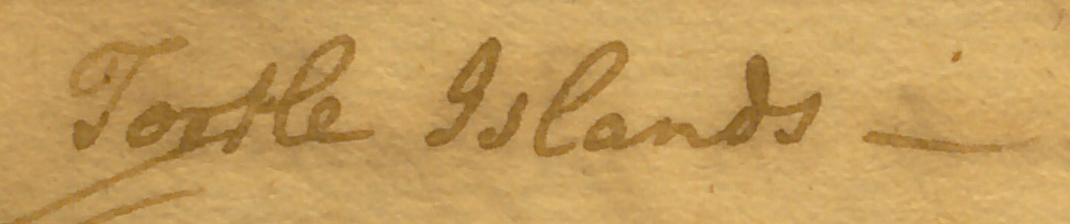Tortle Islands-
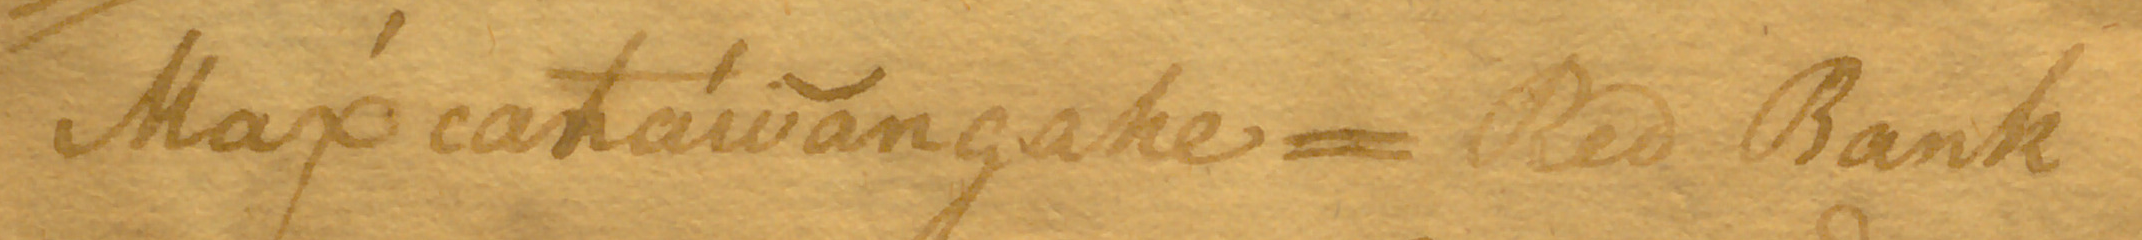Maxcahawangake = Red Bank
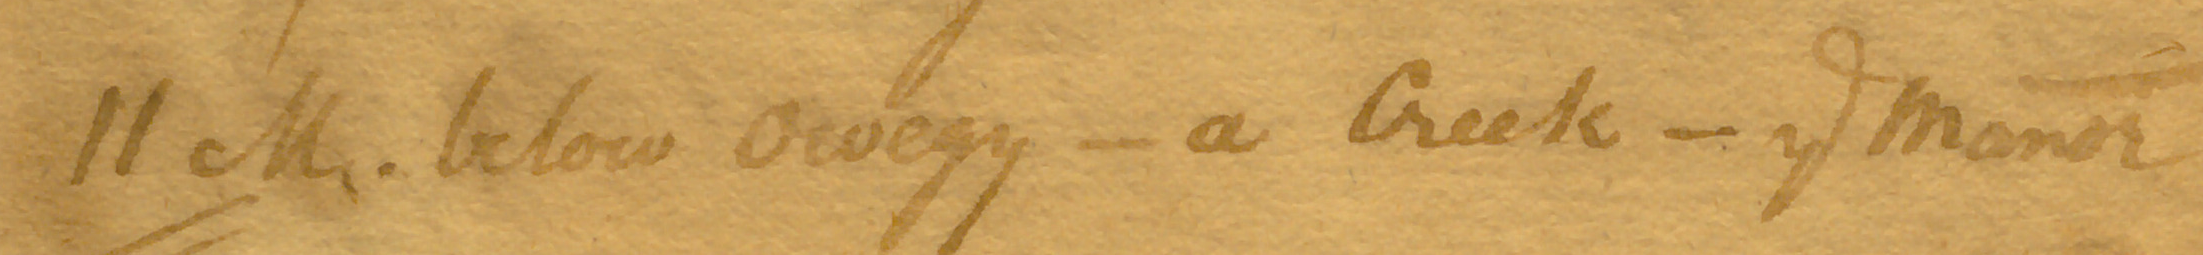11 M. below Owegy - a Creek - y^e Manor
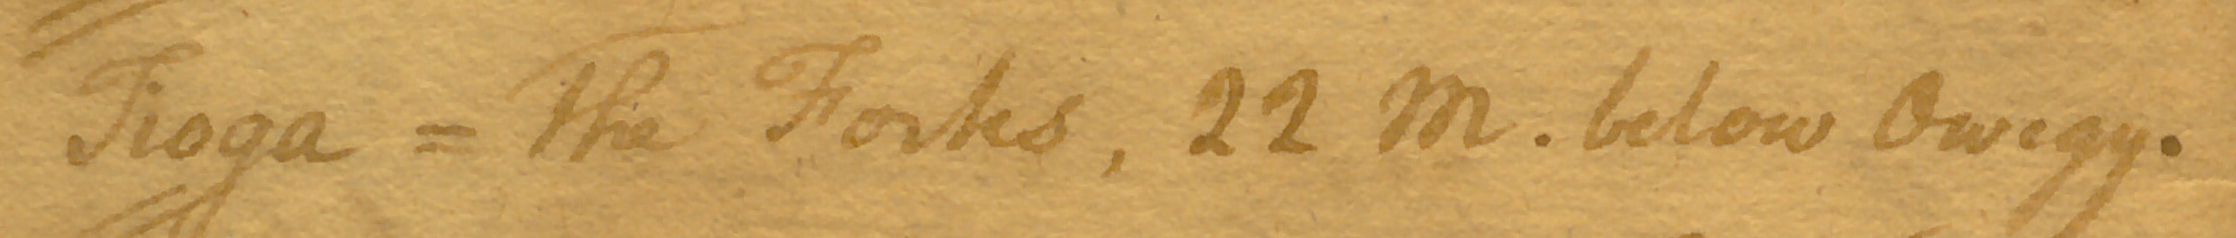Tioga = The Forks, 22 M. below Owegy.
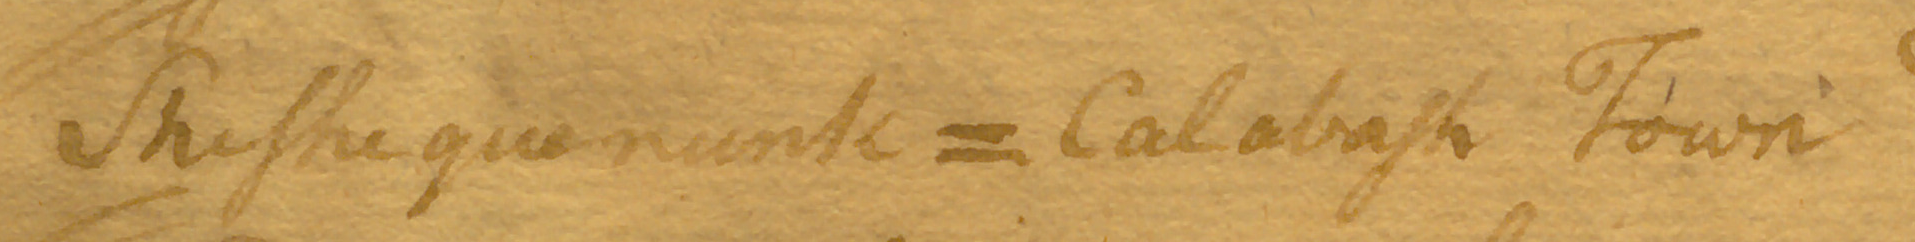Sheshequenunk = Calabash Town
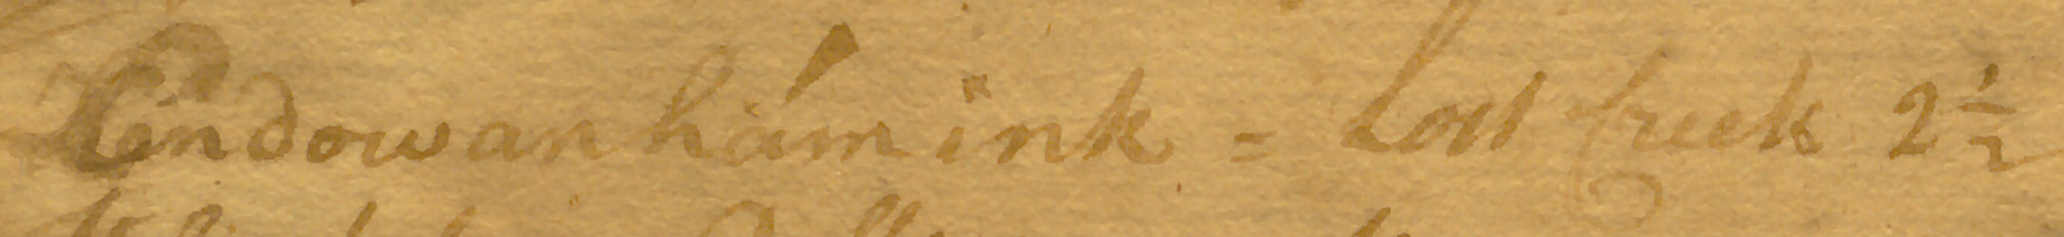Candowanhamink = Lost Creek 2 1/2
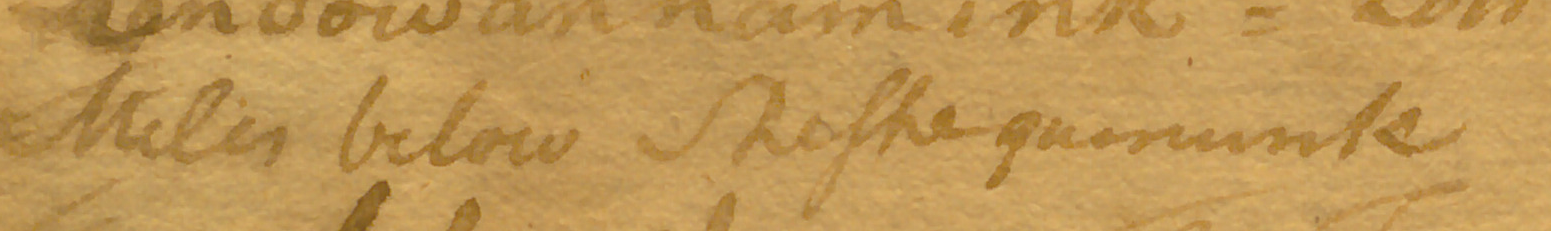Miles below Shoshequenunk
